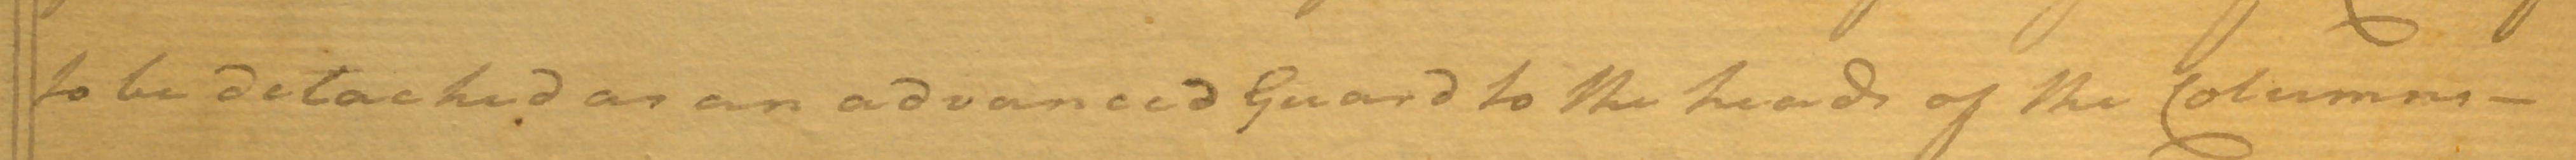to be detached as an advanced Guard to the heads of the Columns-
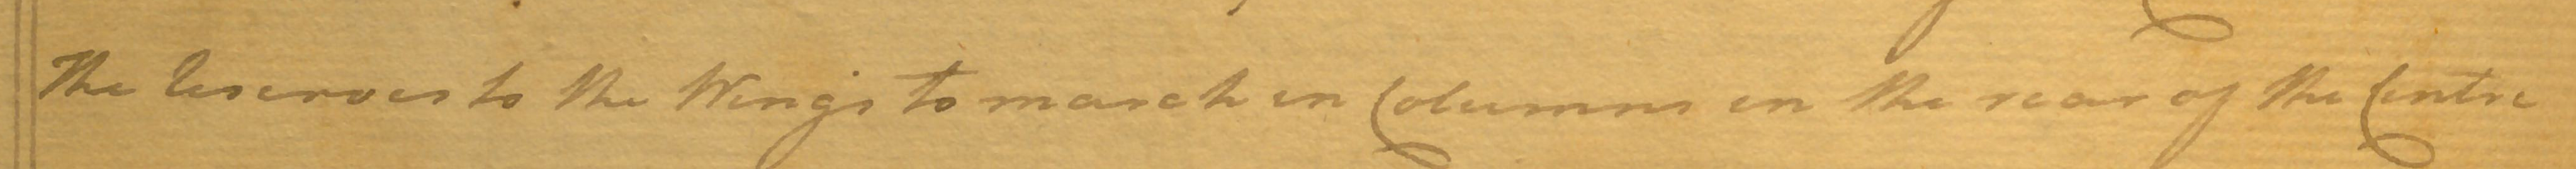The reserves to the Wings to march in Columns in the rear of the Centre
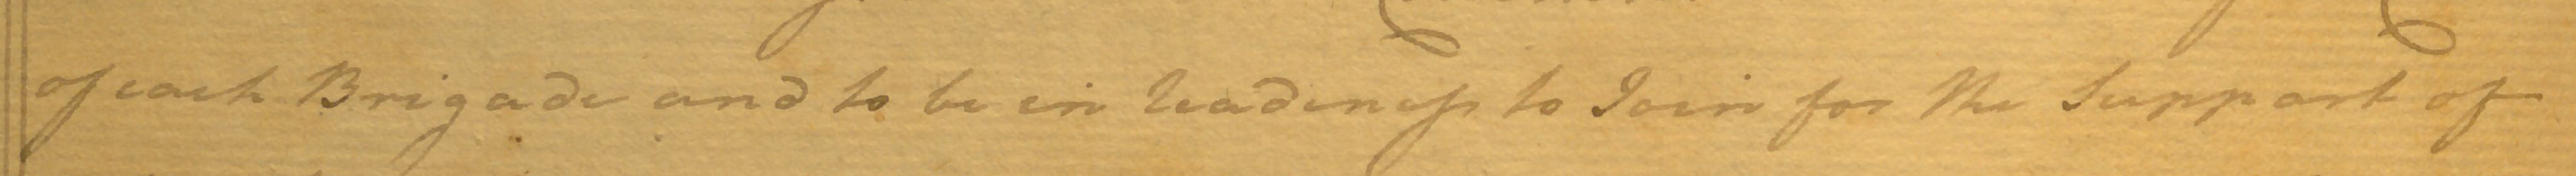of each Brigade and to be in readiness to Join for the support of
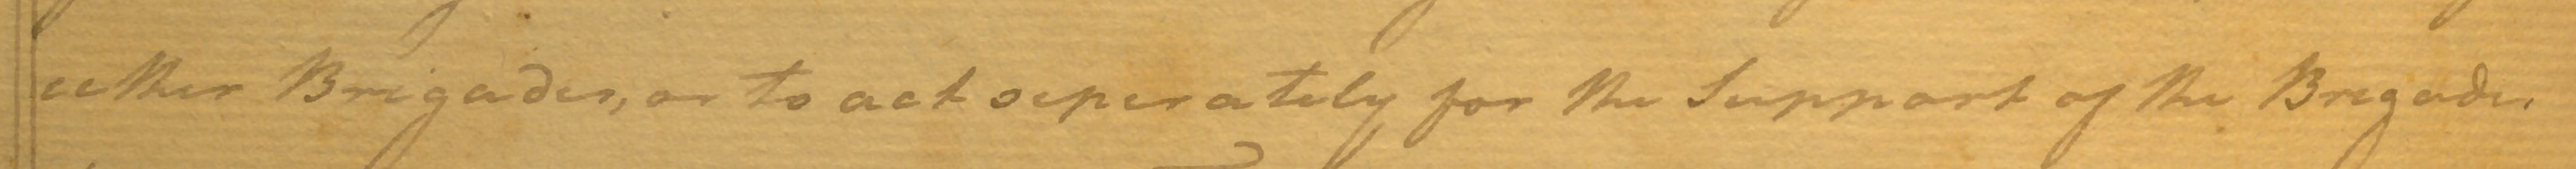either Brigade, or to act seperately for the Support of the Brigade
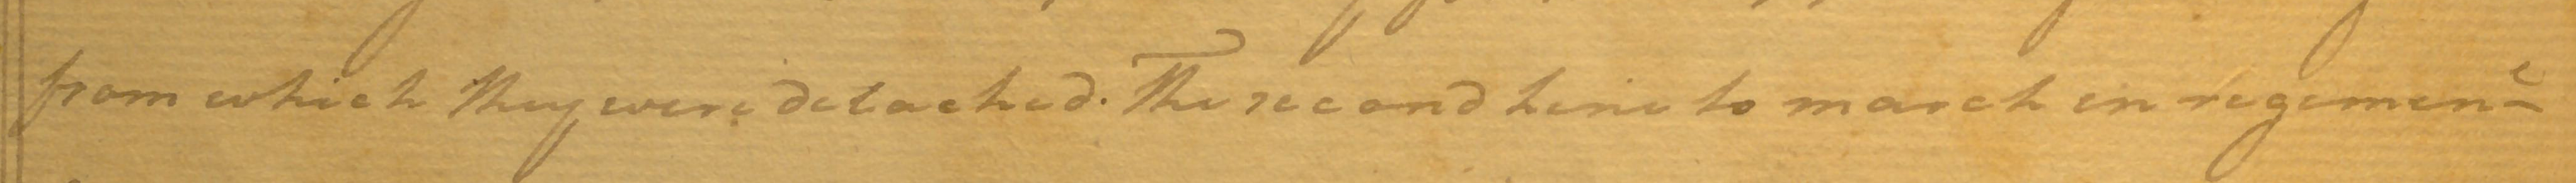from which they were detached. The second Line to march in regiment
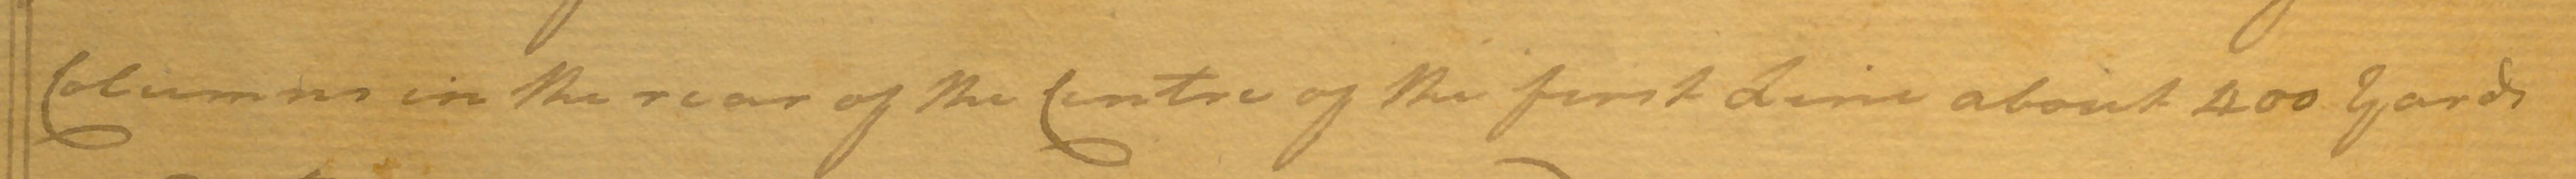Columns in the rear of the Centre of the first Line about 400 yards
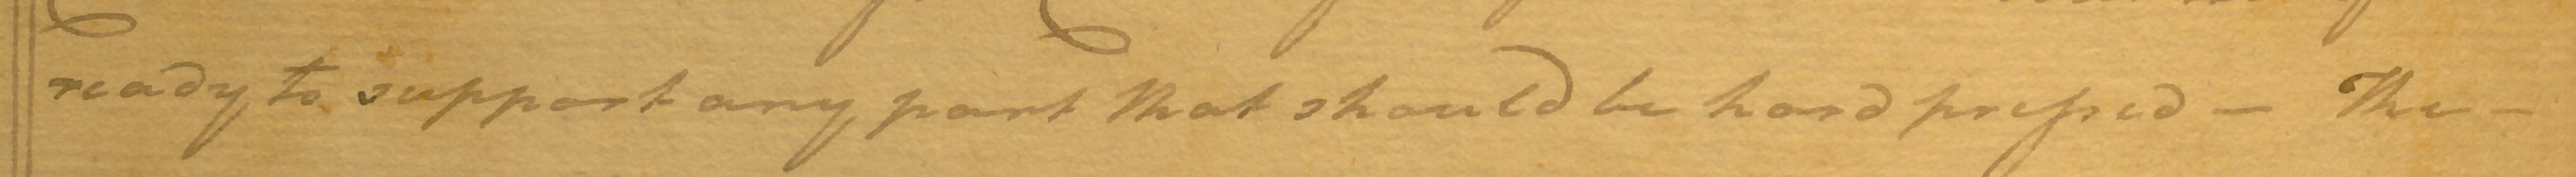ready to support any part that should be hard pressed- The-
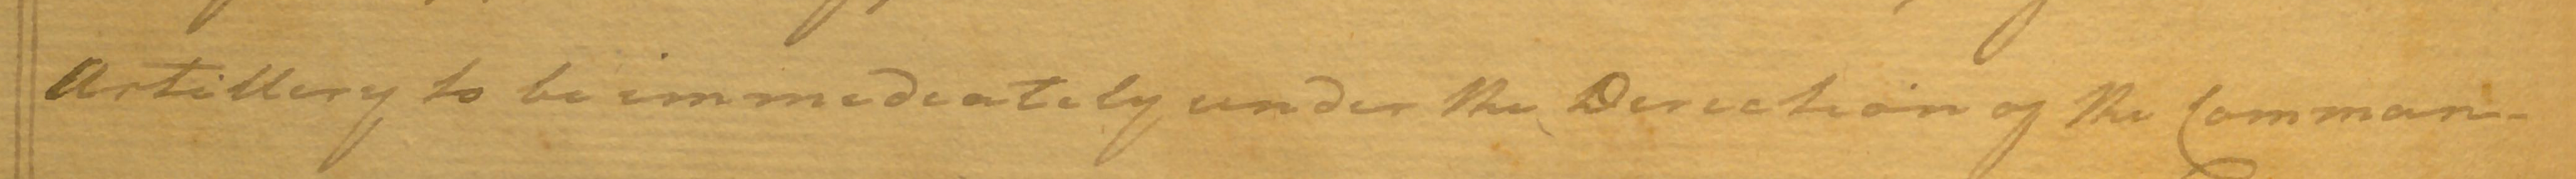Artillery to be immediately under the Direction of the Comman-
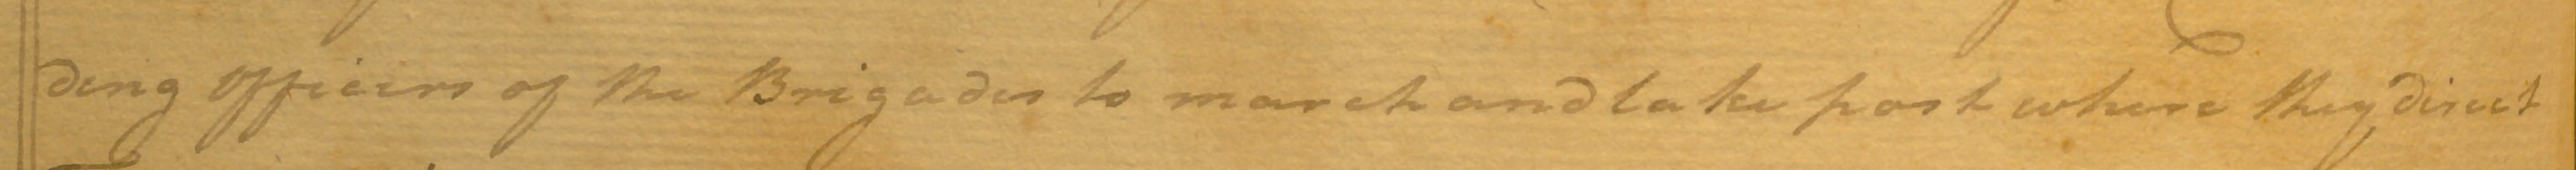ding Officers of the Brigades to march and take post where they direct
